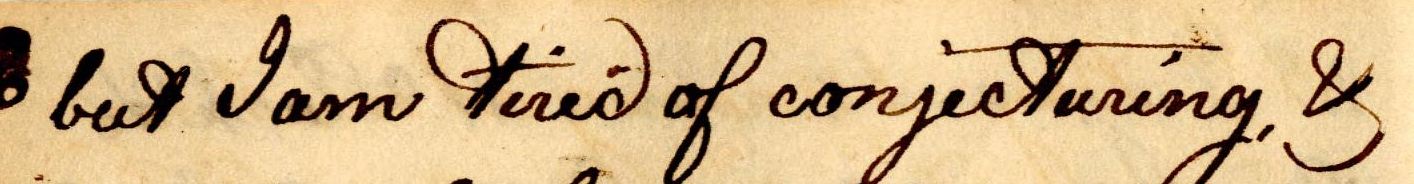but I am tired of conjecturing, &
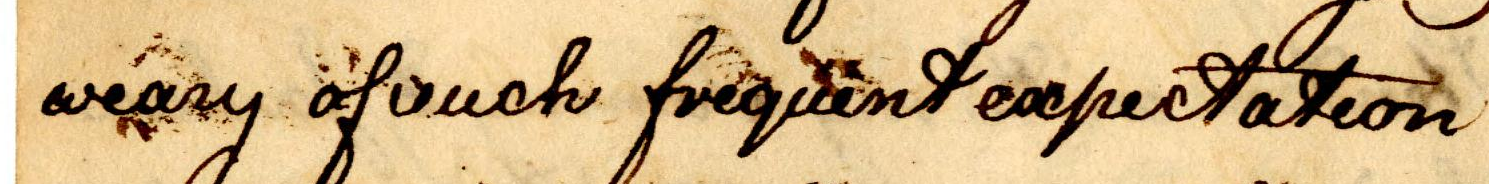weary of such frequent expectation
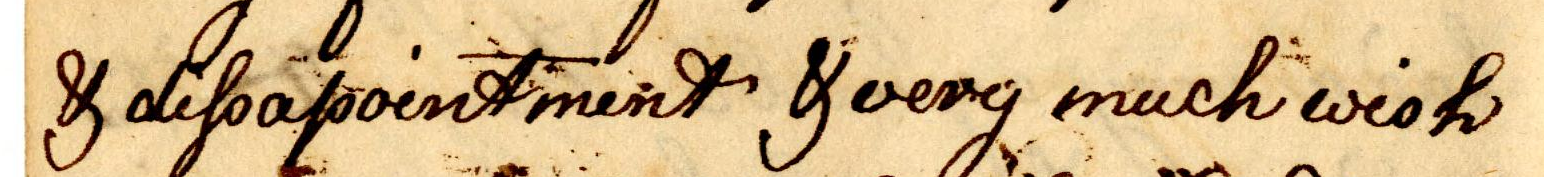& dissapointment & very much wish
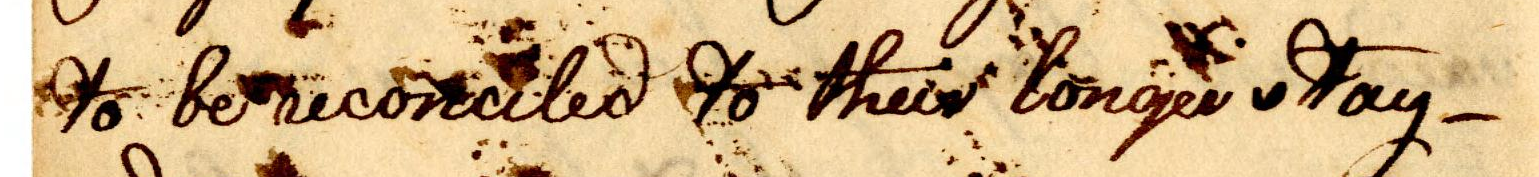to be reconciled to their longer stay -
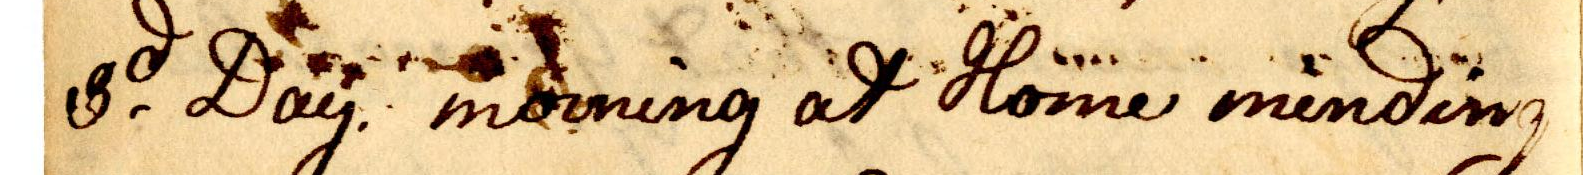3^d Day. morning at Home mending
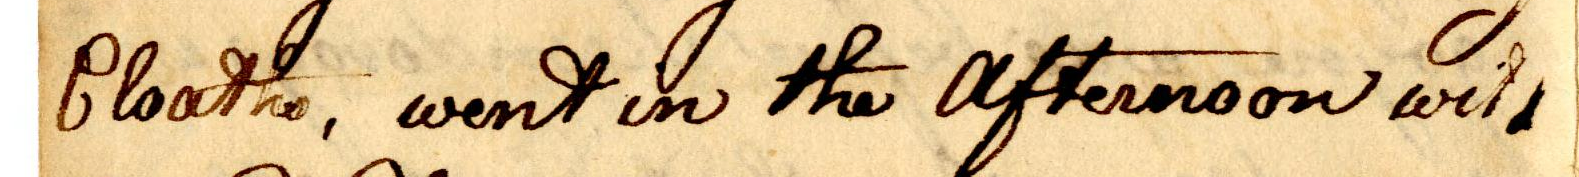Cloaths, went in the Afternoon will
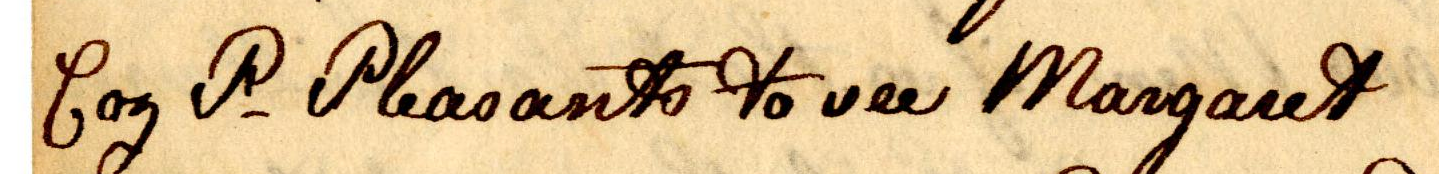Coz P. Pleasants to see Margaret
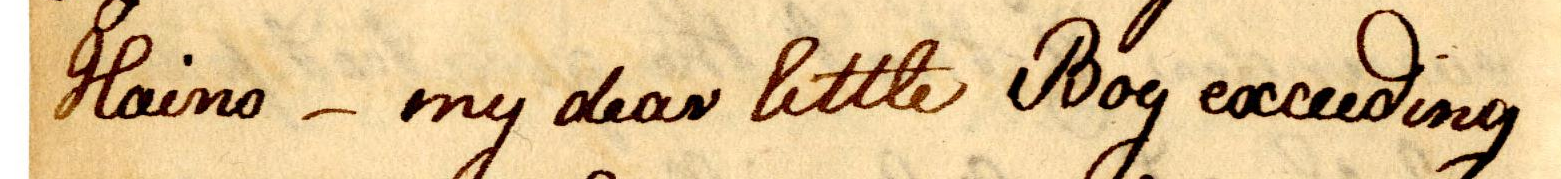Hains- my dear little Boy exceeding
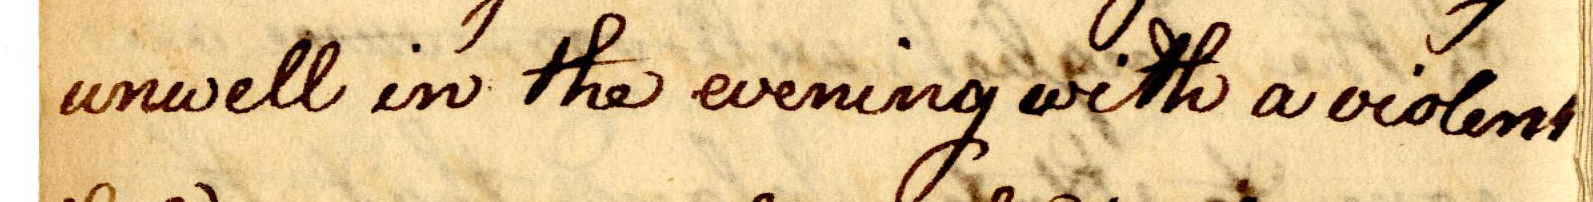unwell in the evening with a violent
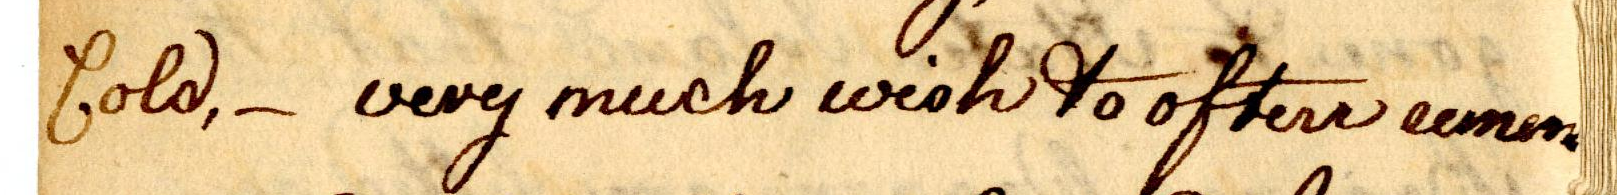Cold,- very much wish to often remem
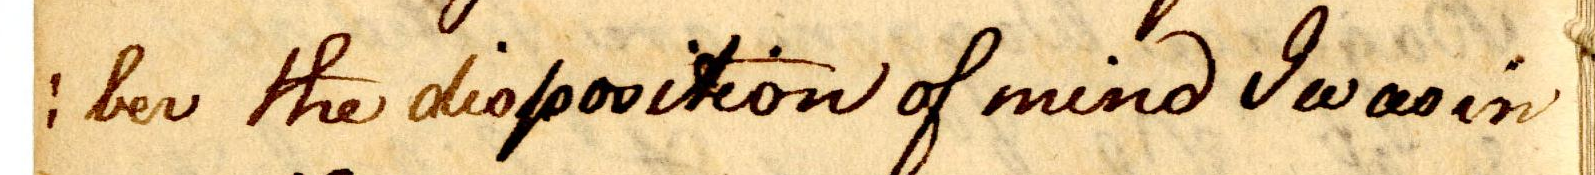-ber the disposition of mind I was in
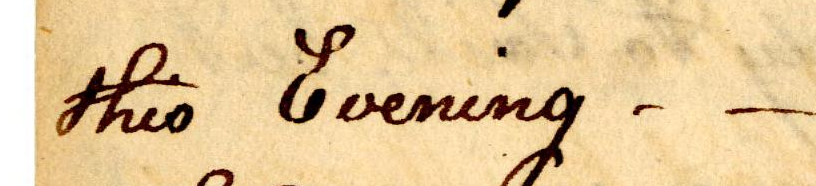this Evening--
